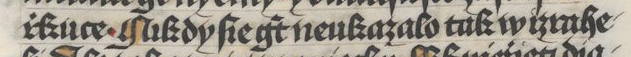ṙkuce.Nikdy ſie ḡt neukazalo tak w izrahe¬
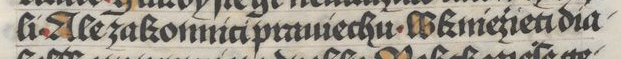li.Ale zakonníci prauíechu.K kníeżieti dia¬
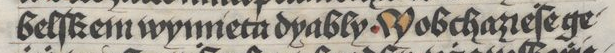belſkem wymieta dyably.Yobchazieẛe ge¬
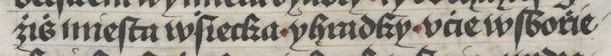żiṡ mieſta wẛiecka.yhradky.vċie wſboṙíe¬
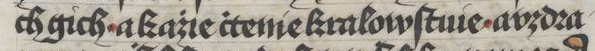ch gich.a każie ċteníe kralowſtuie.avzdra¬
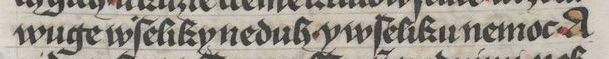wuge wẛeliky neduh.y wẛeliku nemoc.A¬
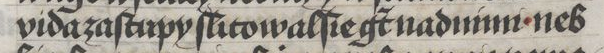vida zaſtupy ſlitowal ſie ḡt nad ními.neb
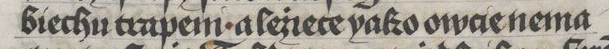bíechu trapeni.a leżiece yako owcie nema¬
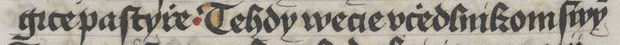gice paſtyṙe.Tehdy wecie vċedlníkom ſwȳ
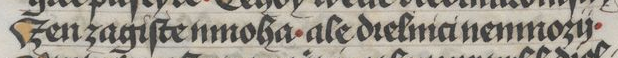Ten zagiſte mnoha.ale dielnici nemnozij.
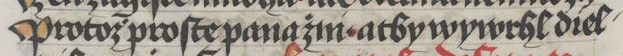Protoż proſte pana żní.atby wywrhl díel¬
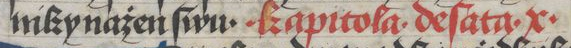niky nażen ſwu..kapitola.deſata.x.
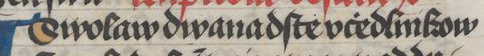Swolaw dwanadſte vċedlnikow
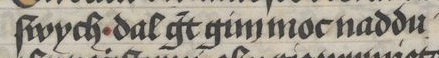ſwych.dal ḡt gim noc naddu¬
